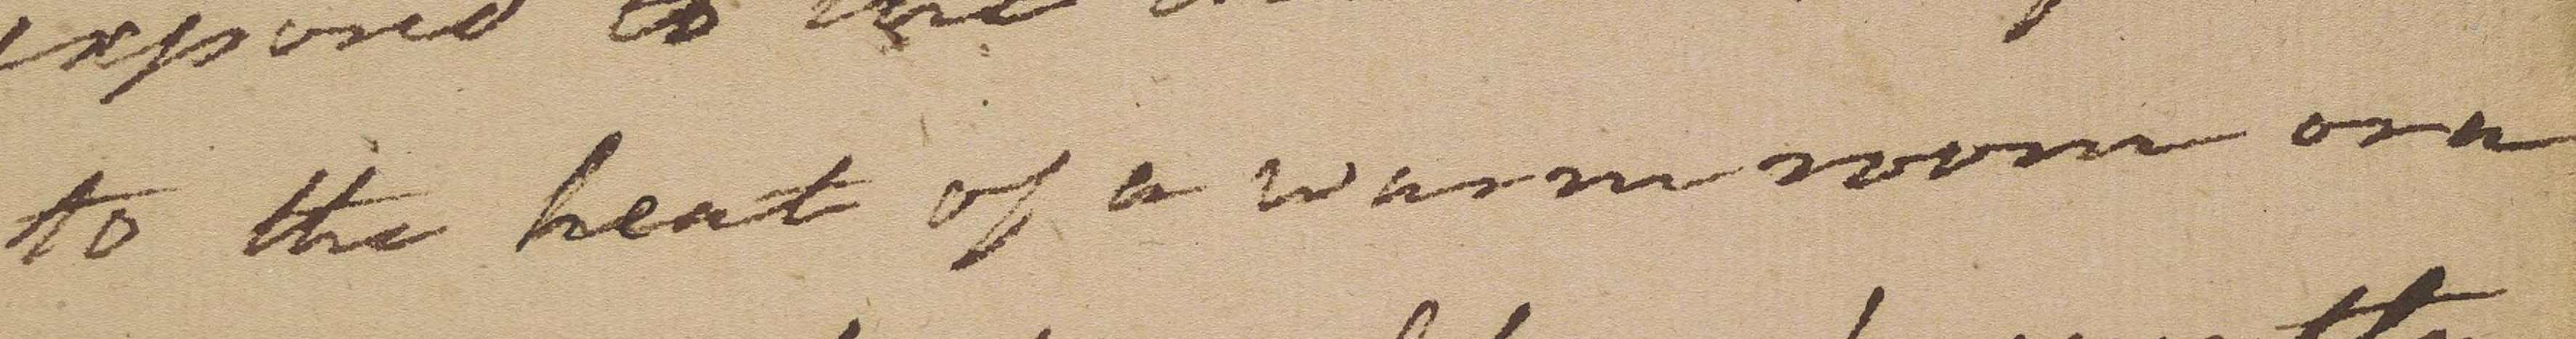to the heat of a warm room or
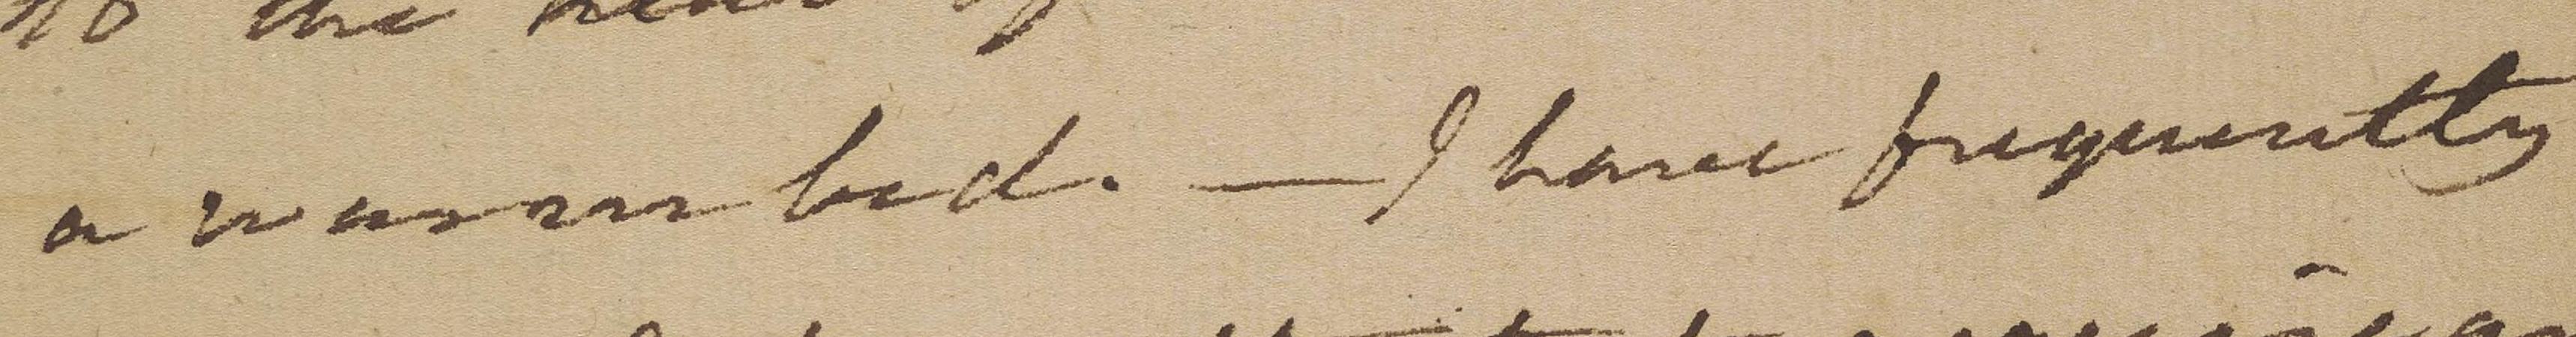a warm bed.- I have frequently
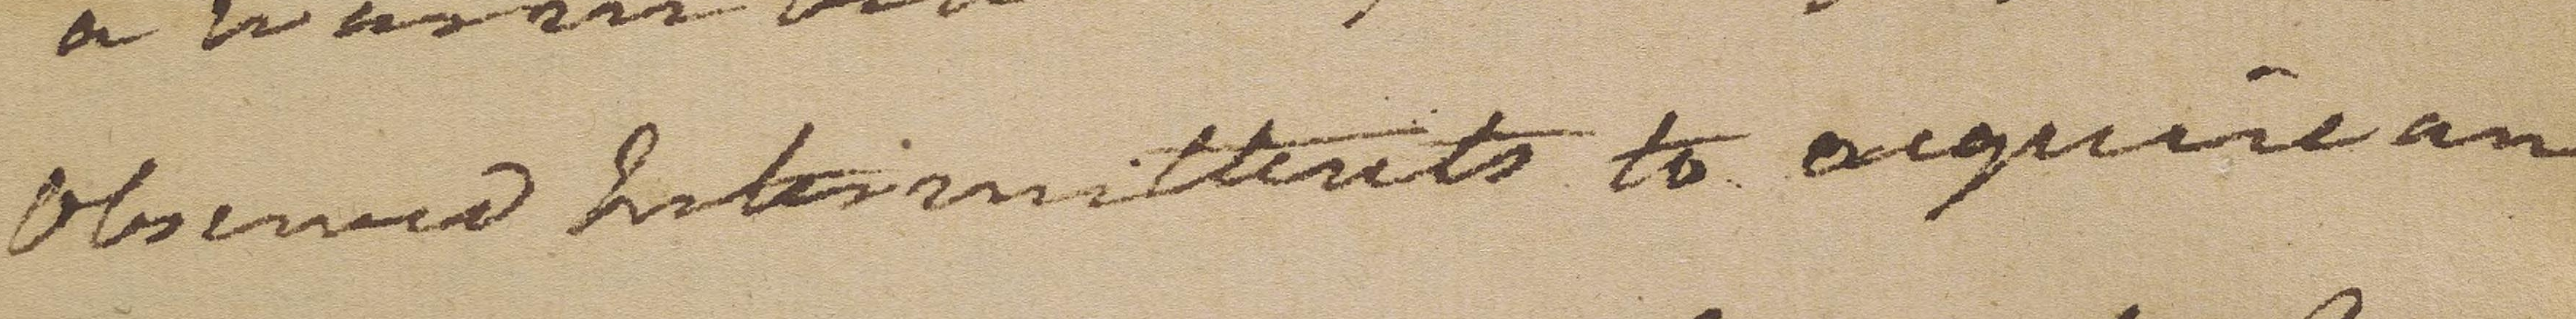observed Intermittents to acquire an
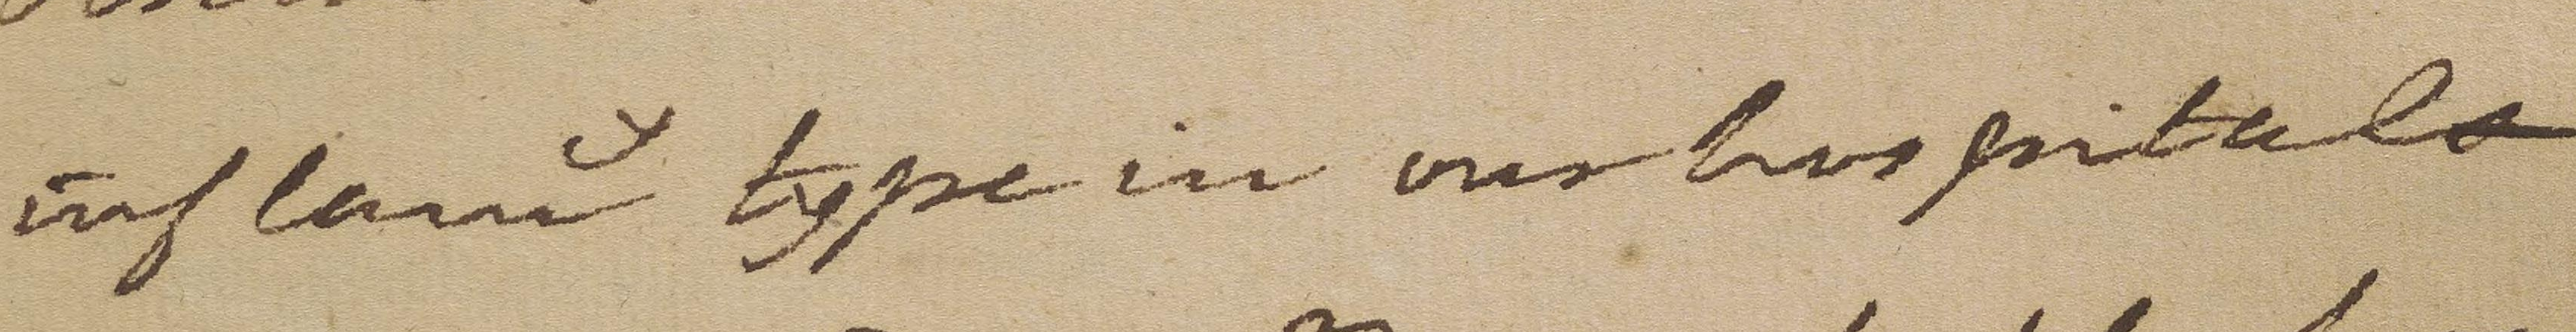inflam^y type in our hospitals
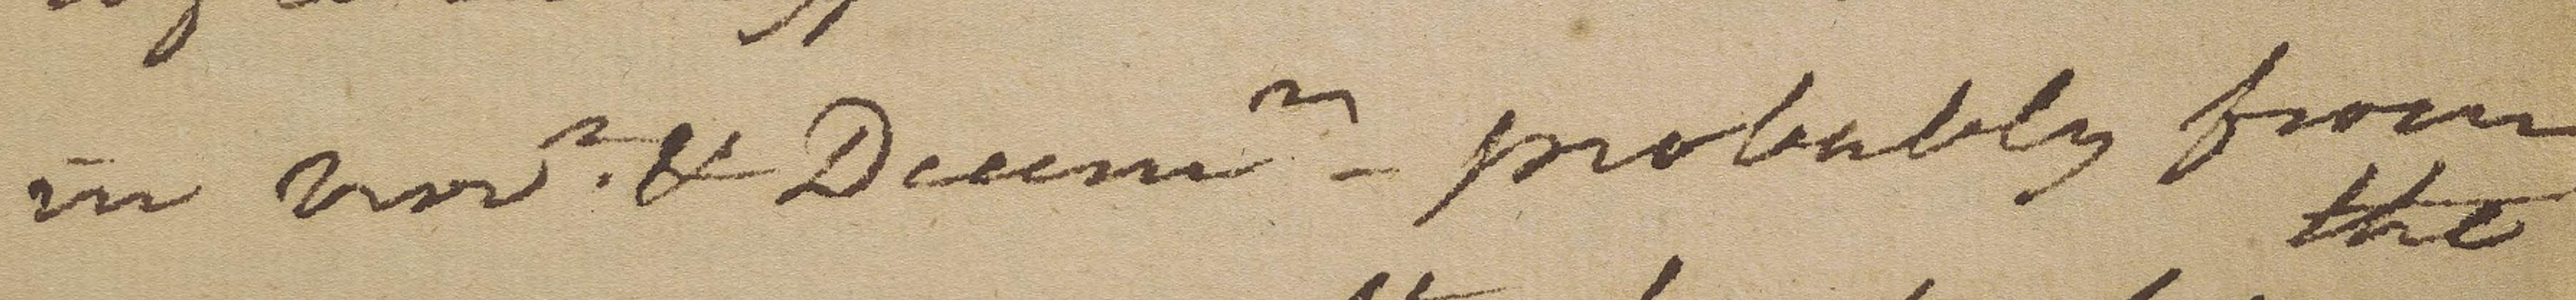in Nov^r & Decem^r probably from
